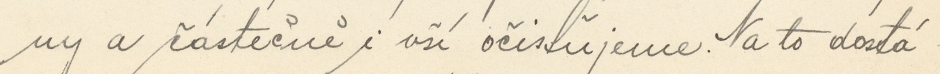ny a částečně i vší očisťujeme. Na to dostá-
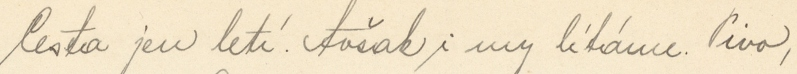Cesta jen letí. Avšak i my létáme. Pivo,
